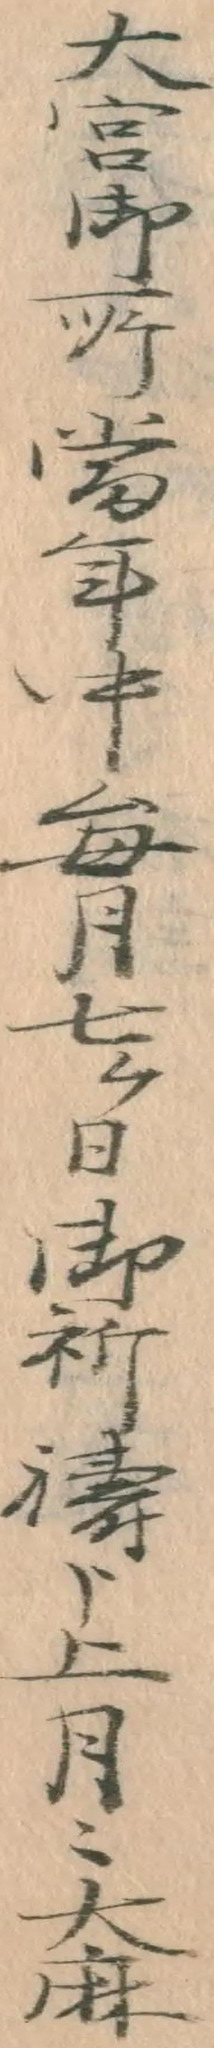大宮御所當年中毎月七ケ日御祈祷申上月々大麻
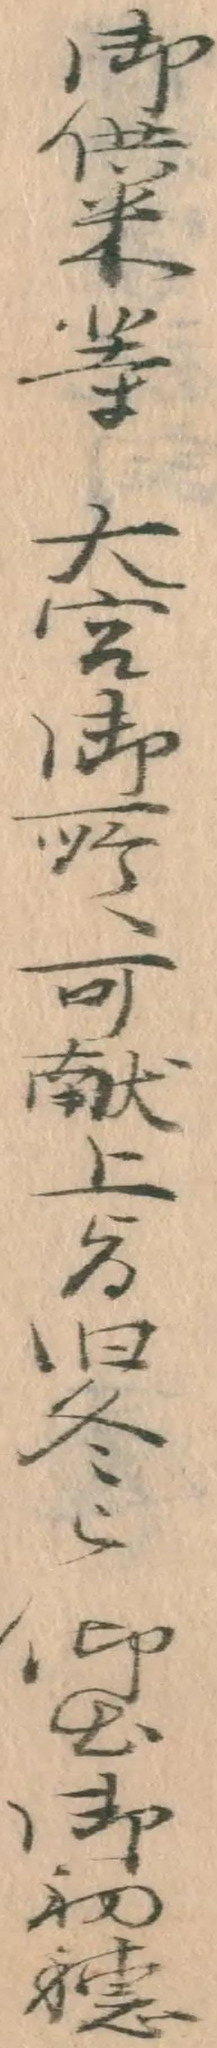御供米等大宮御所へ可献上旨旧冬被仰出御初穂
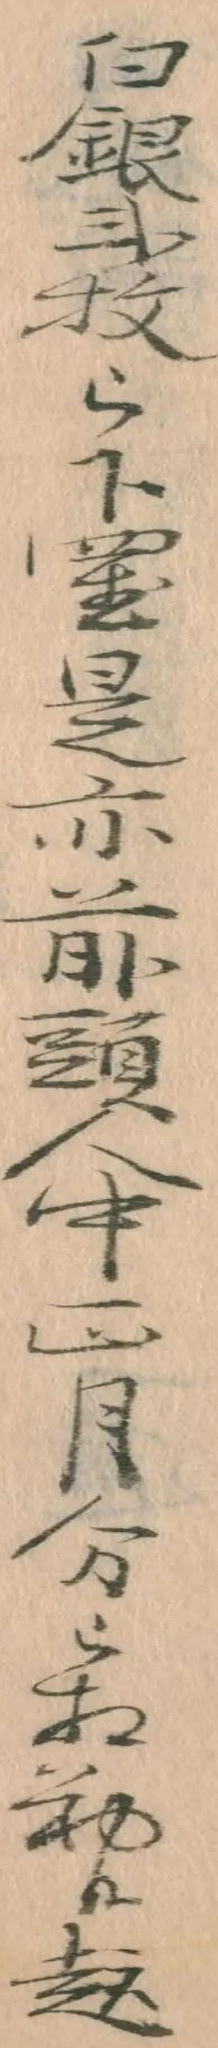白銀弐枚被下置是亦前頭人中正月分被相勤候趣
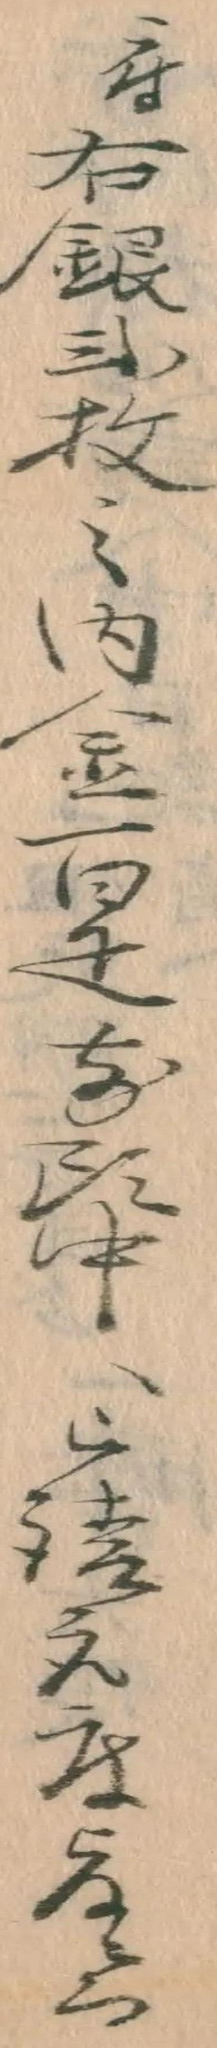ニ付右銀弐枚之内金百疋前頭中へ被請取度旨ニ而
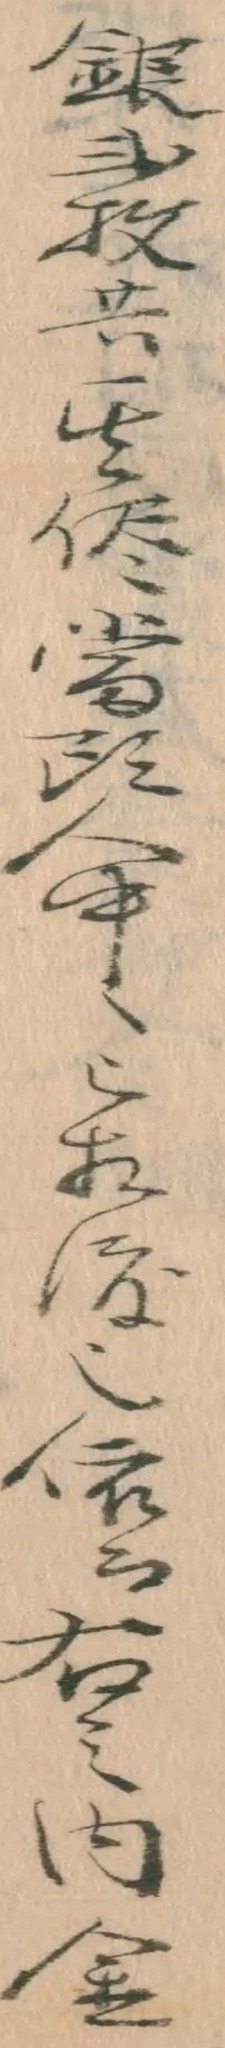銀弐枚共其侭當頭人中へ被相渡也依而右之内金
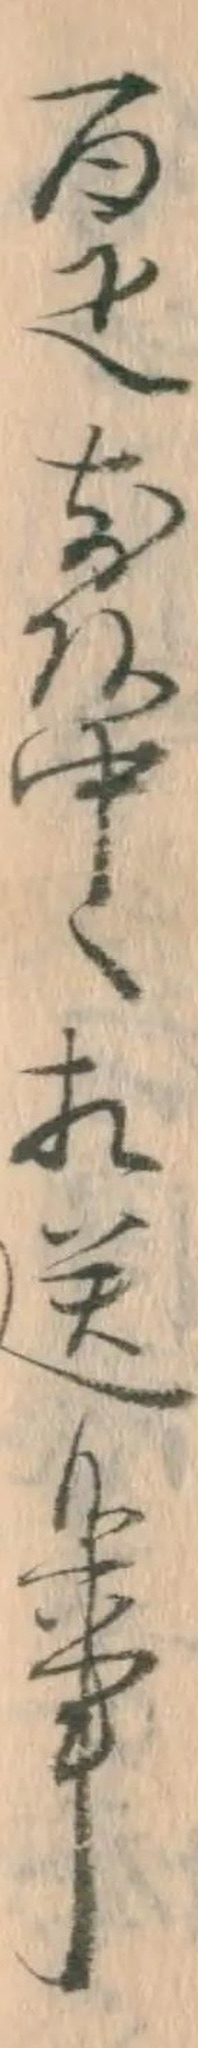百疋前頭中へ相送候事
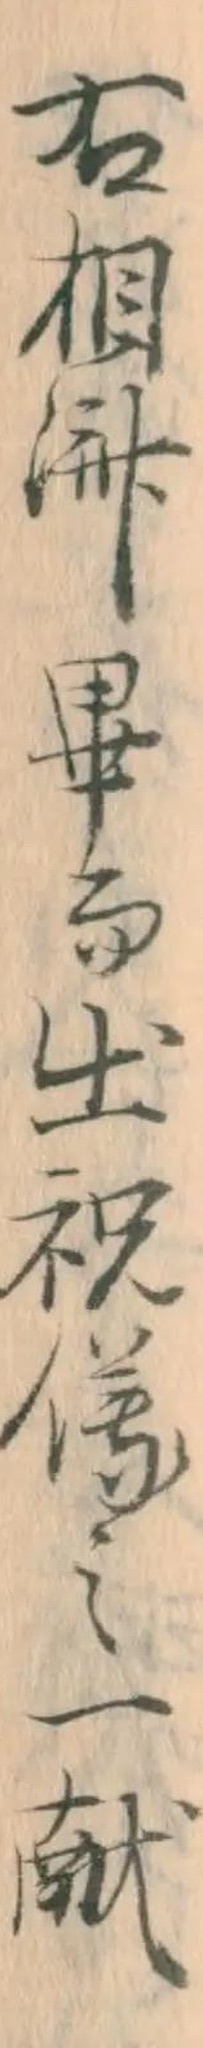右相済畢而出祝儀之一献
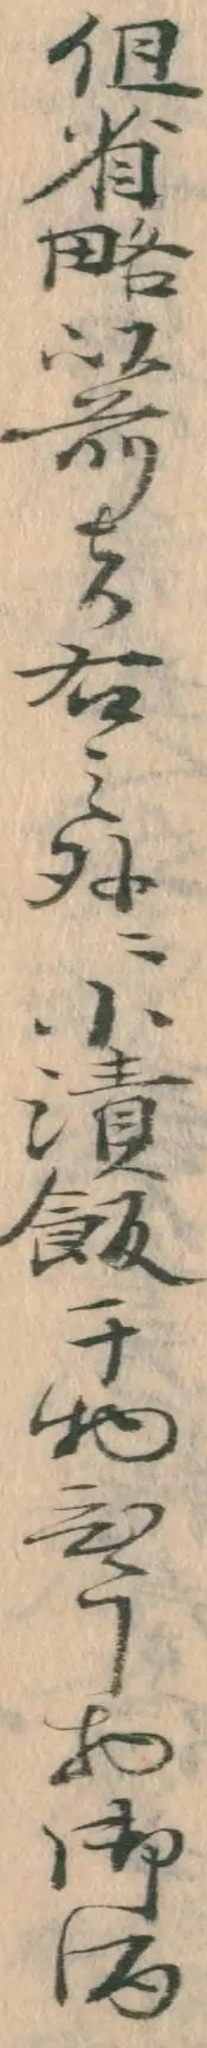但省略以前者右之外に小漬飯干物ひたし物御酒
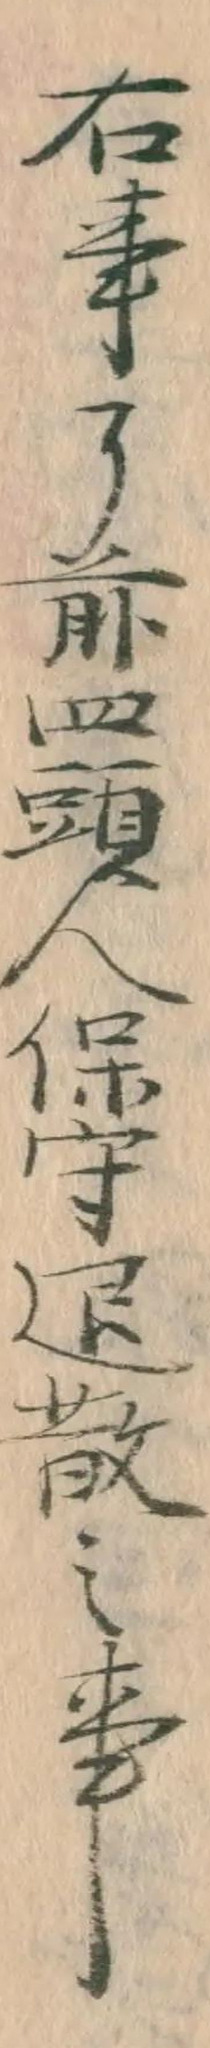右事了前四頭人保守退散之事
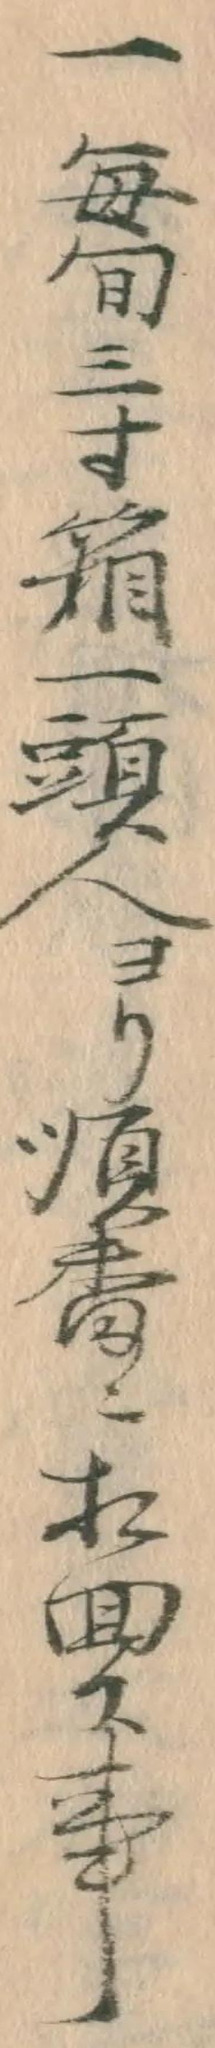一毎旬三寸箱一頭人ヨリ順番ニ相回候事
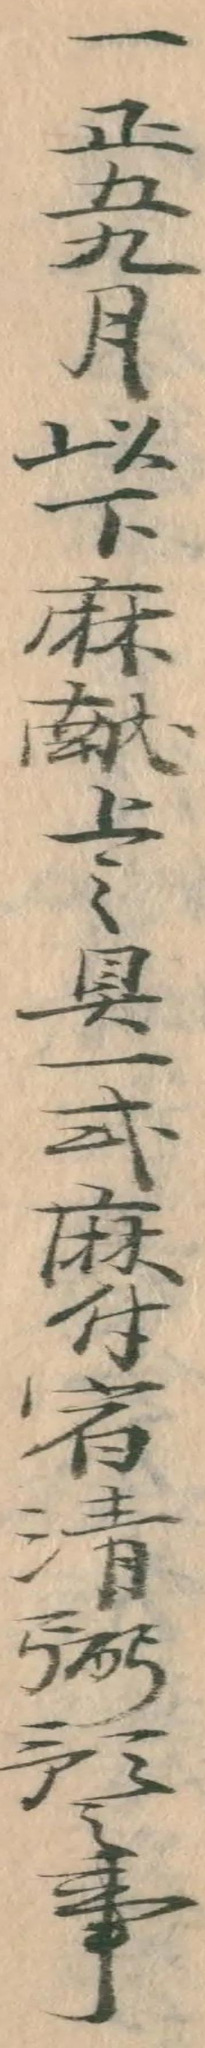一正五九月以下麻献上之具一式麻付宿清弼預之事
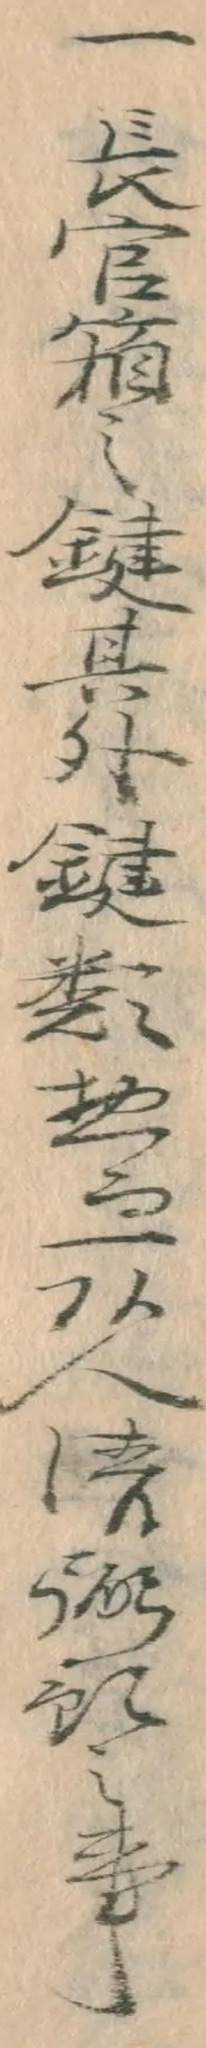一長官箱之鍵其外鍵類惣而一頭人清弼預之事
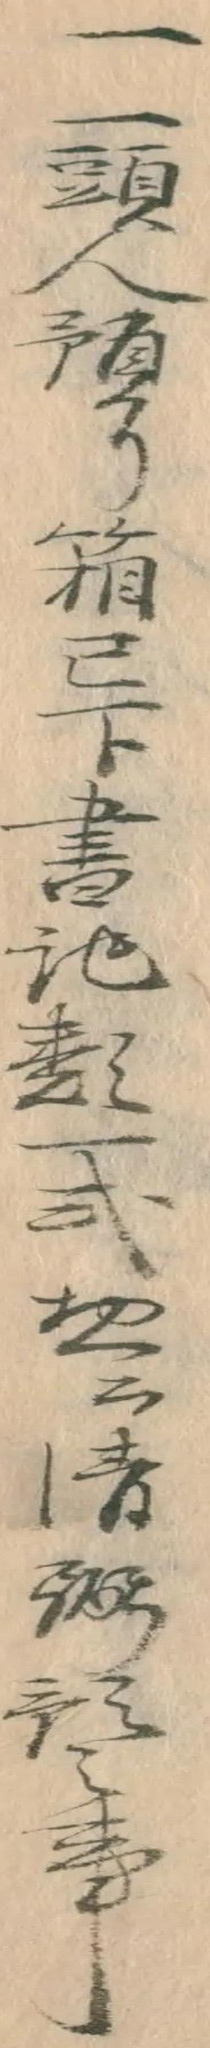一一頭人預リ箱已下書記類一式惣而清弼預之事
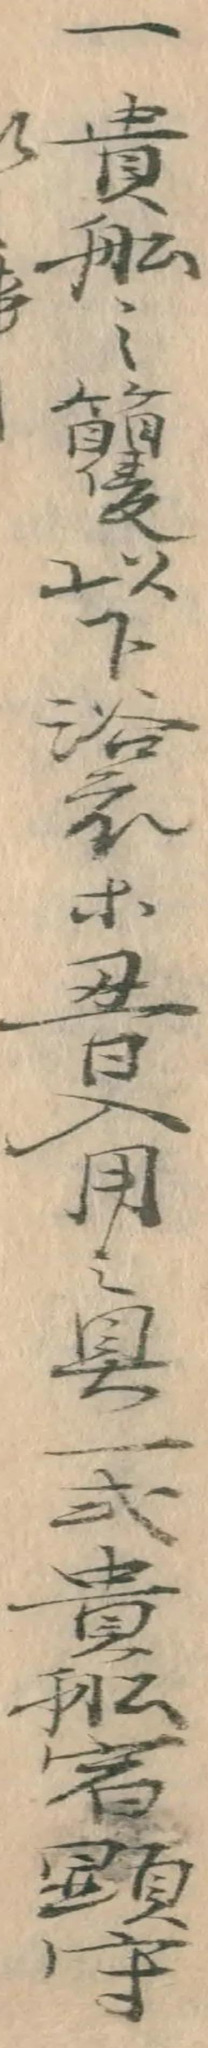一貴舩之籰以下浴衣等丑日入用之具一式貴舩宿顕守

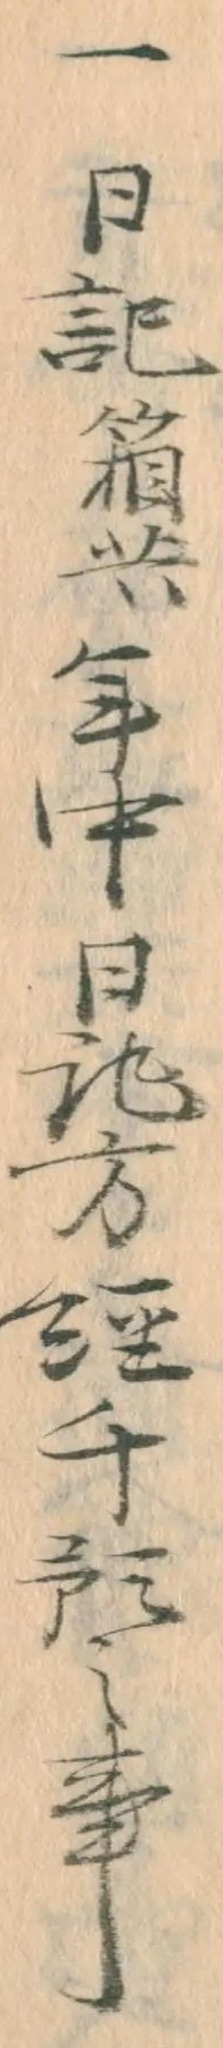一日記箱共年中日記方経千預之事
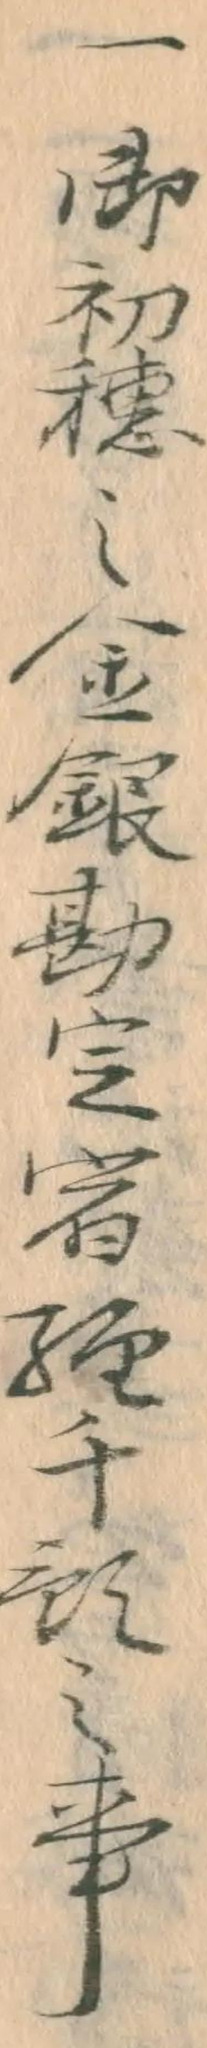一御初穂之金銀勘定宿経千預之事
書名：賀茂社記録. 第72冊
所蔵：国立国会図書館 National Diet Library, JAPAN
